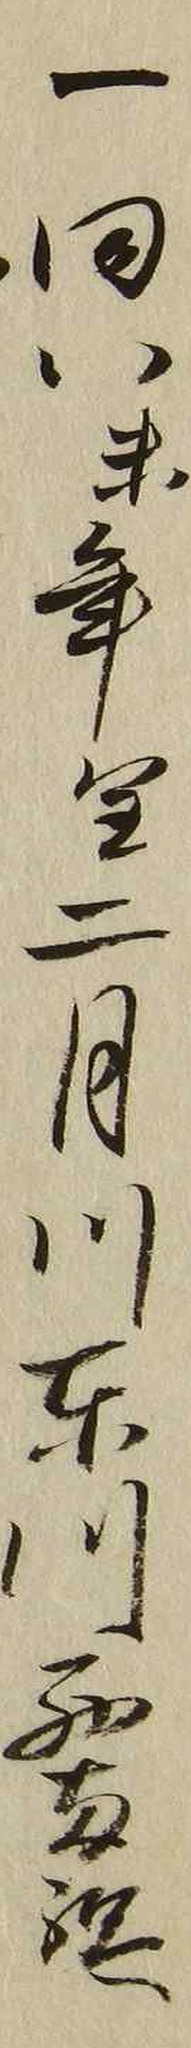一同八未年閏二月川東川西両組へ
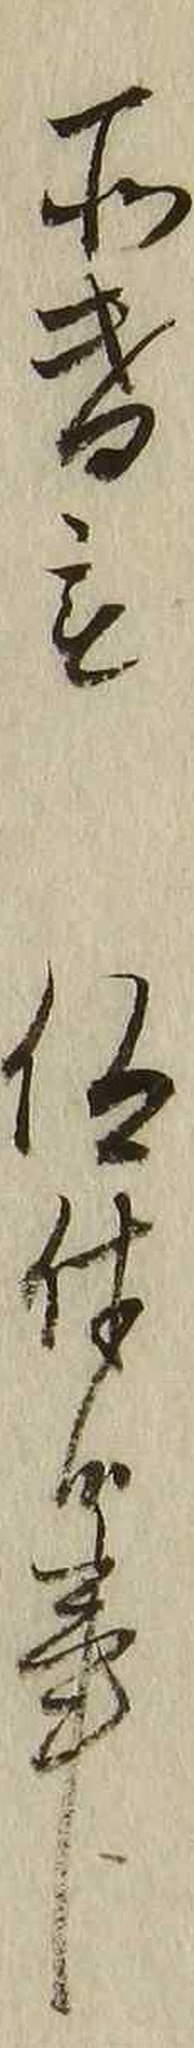所替被仰付候事
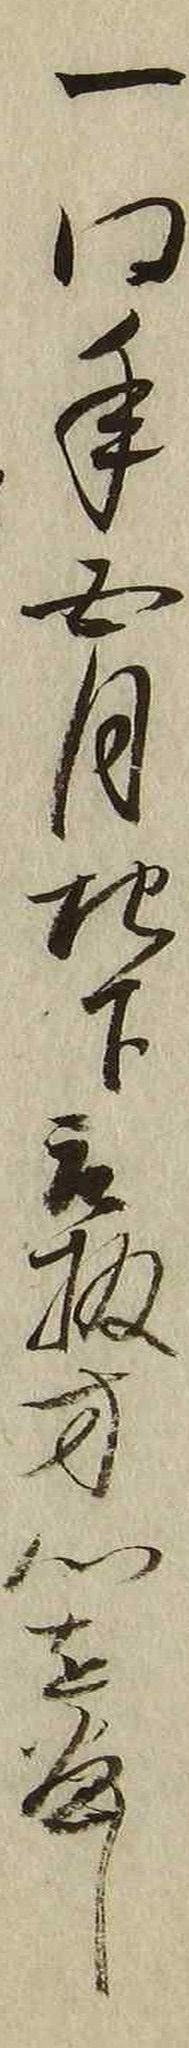一同年五月地下取扱方心を尽し
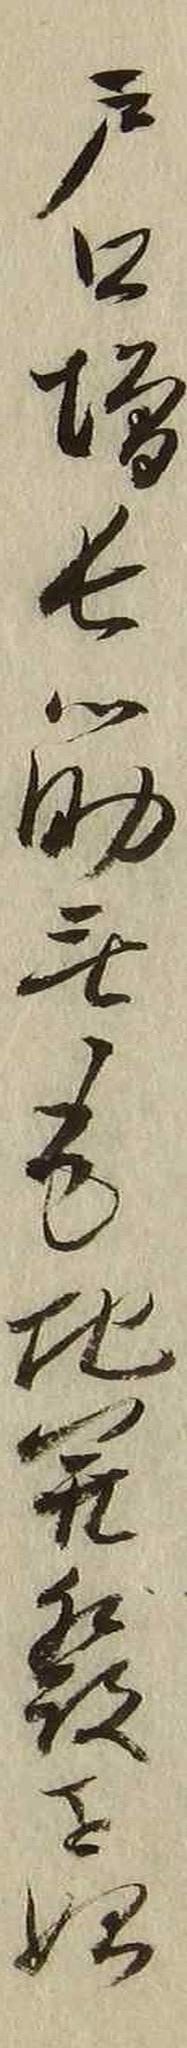戸口増長筋無毛地開発を始
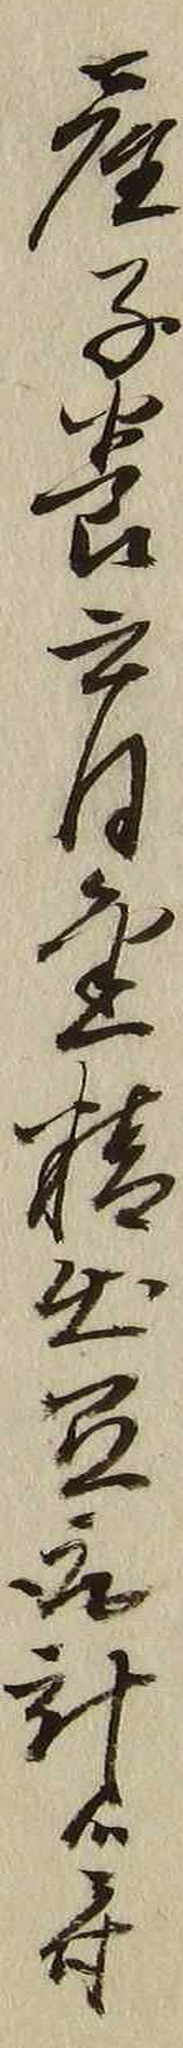産子養育金精出宜取計候ニ付
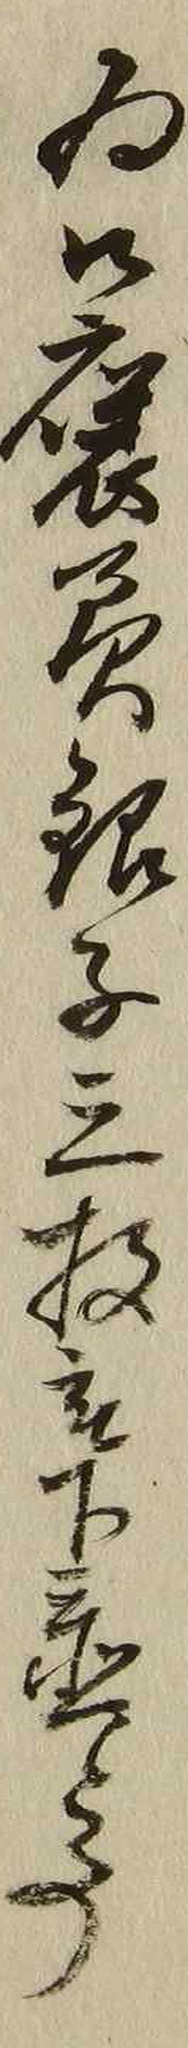為御褒美銀子三枚被下置候事
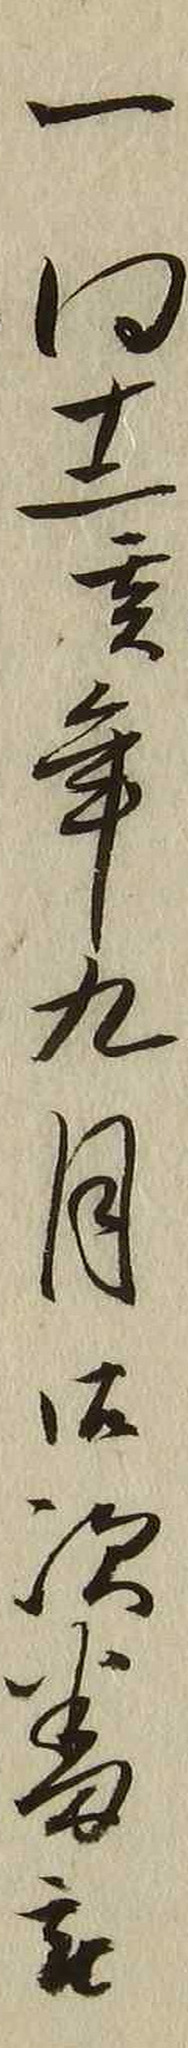一同十二亥年九月御次番被
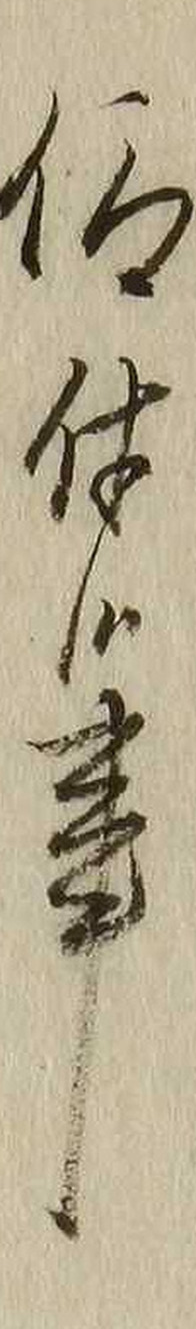仰付候事
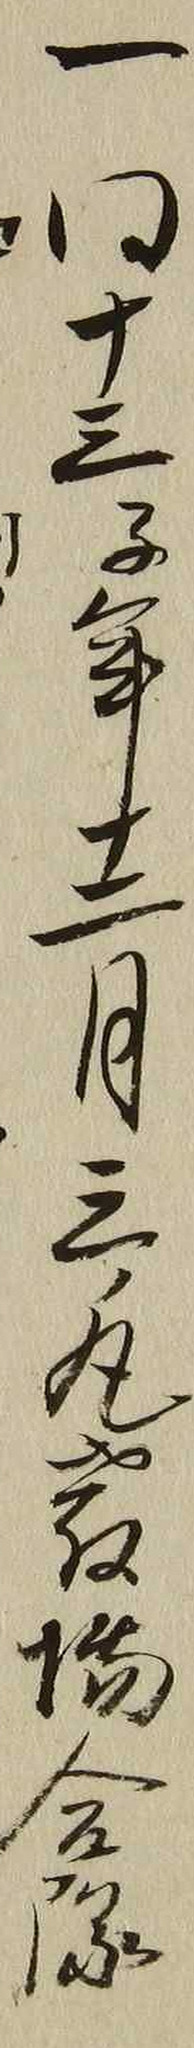一同十三子年十二月三ノ丸教場合隊
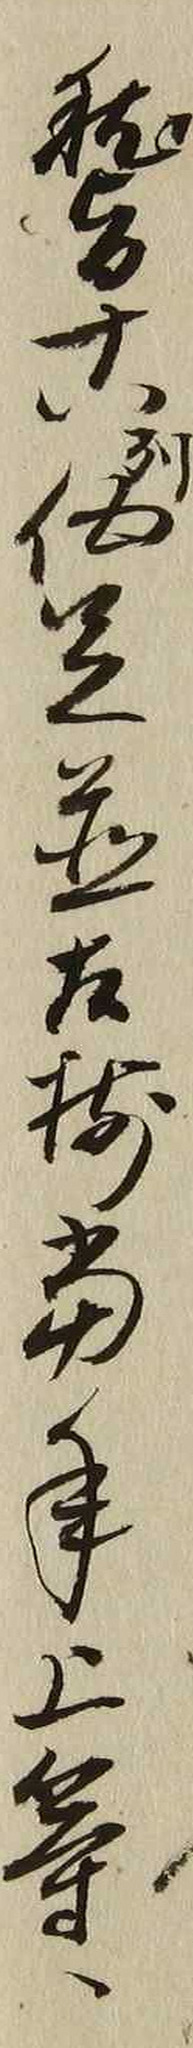稽古列伍足並相揃当年上等へ
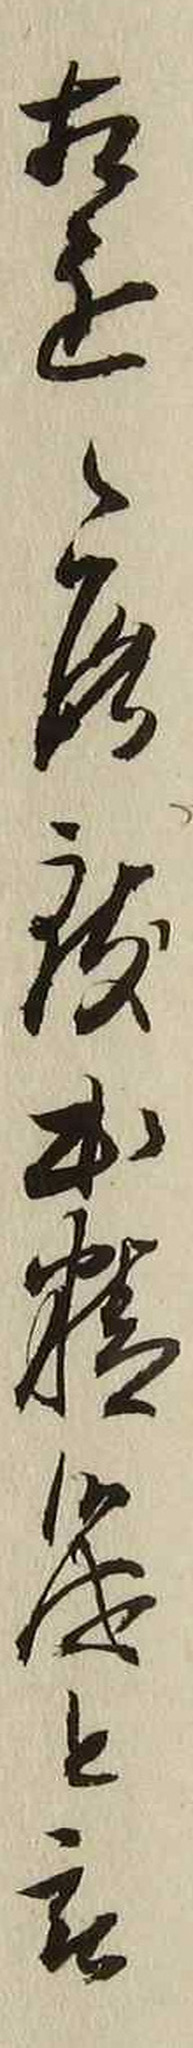相進候段致出精候儀と被
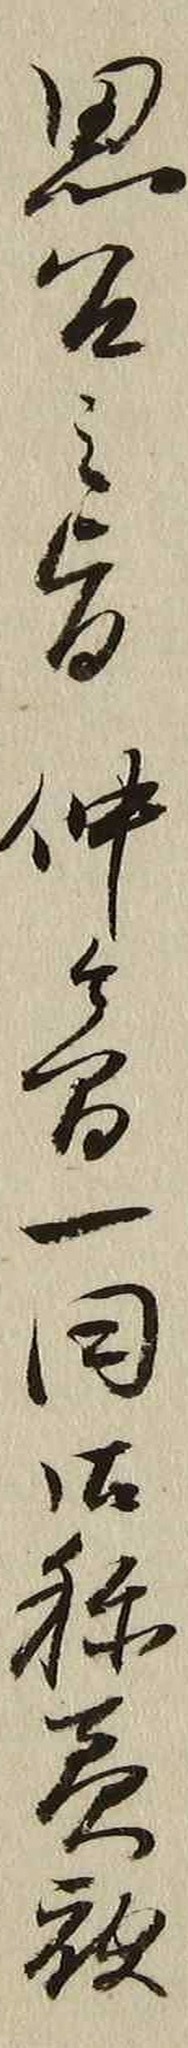思召之旨仲ヶ間一同御称美被
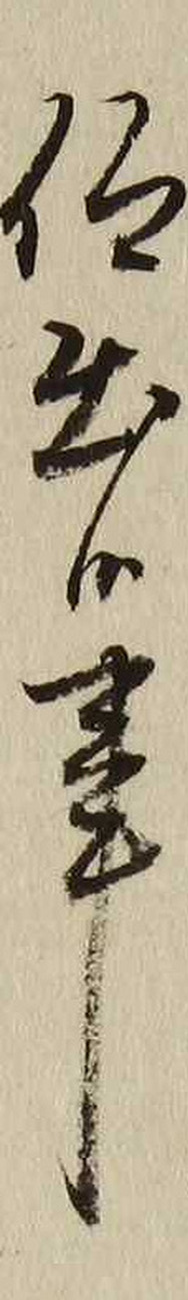仰出候事
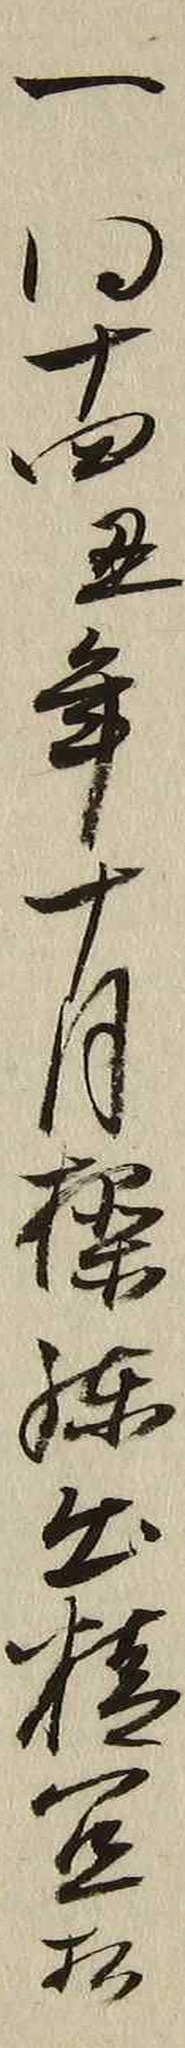一同十四丑年十月操練出精宜相
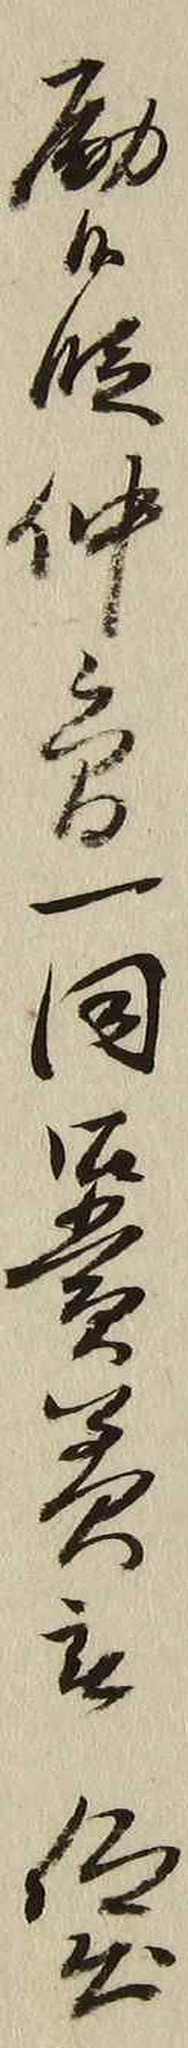励候段仲ヶ間一同御賞美被仰出
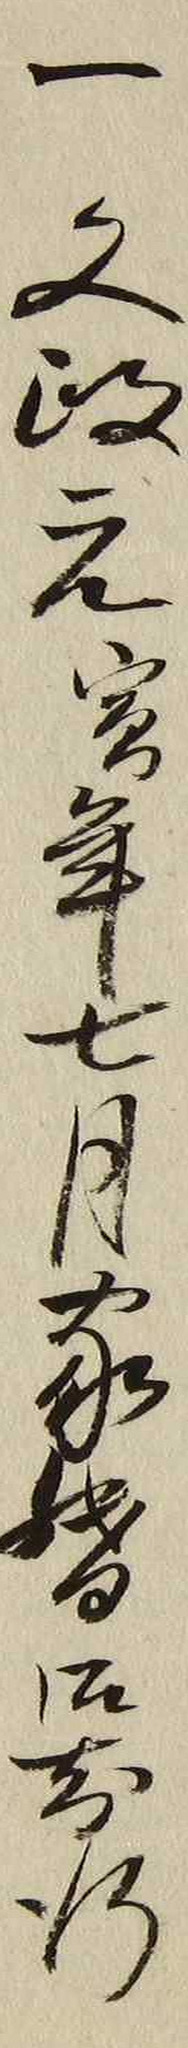一文政元寅年七月家督御知行
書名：諸士系譜　巻之352　す之部2
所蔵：会津若松市立会津図書館
